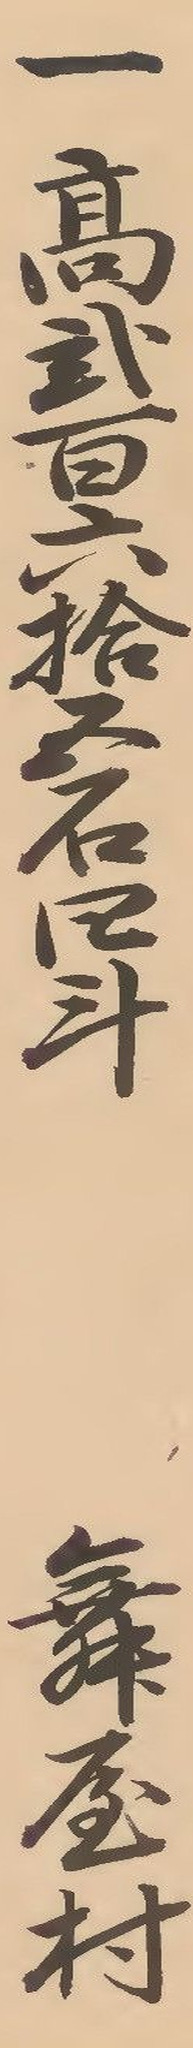一高弐百六拾五石四斗舞屋村
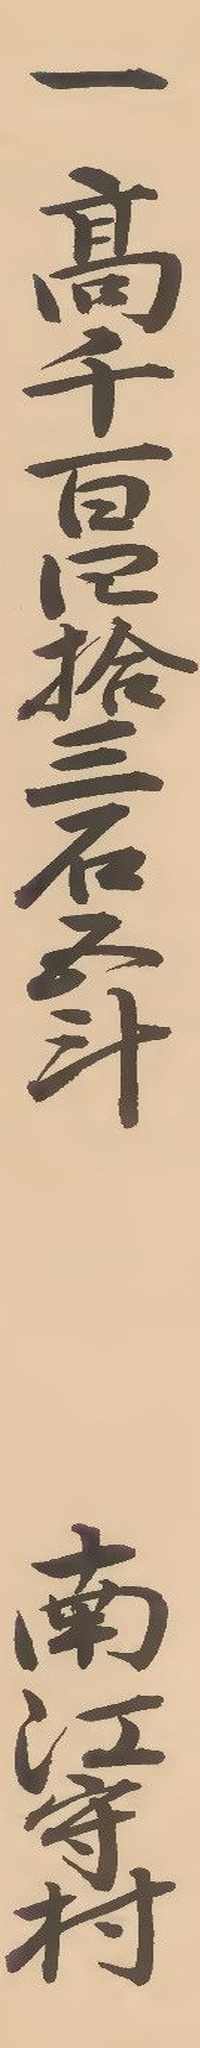一高千百四拾三石五斗南江守村
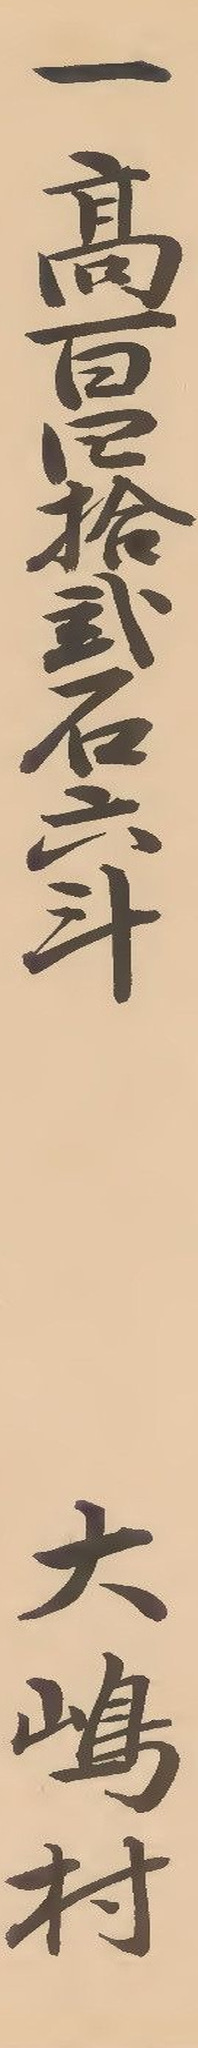一高百四拾弐石六斗大島村

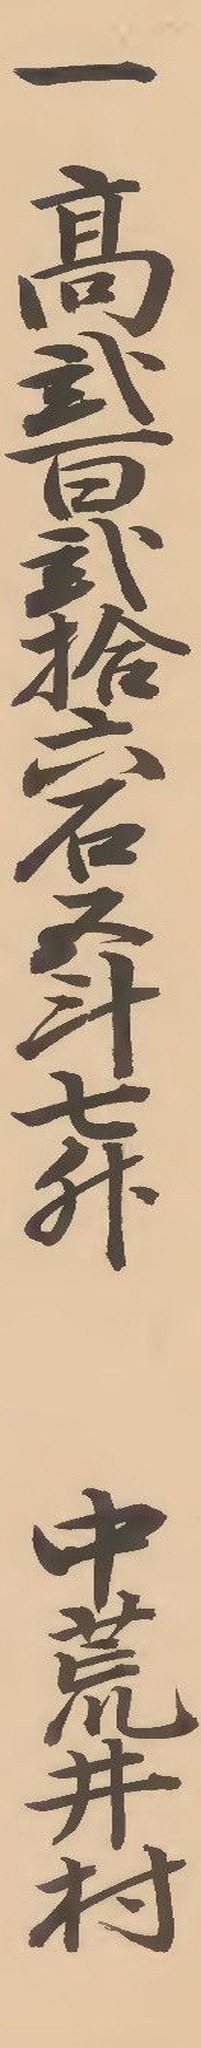一高弐百弐拾六石五斗七升中荒井村
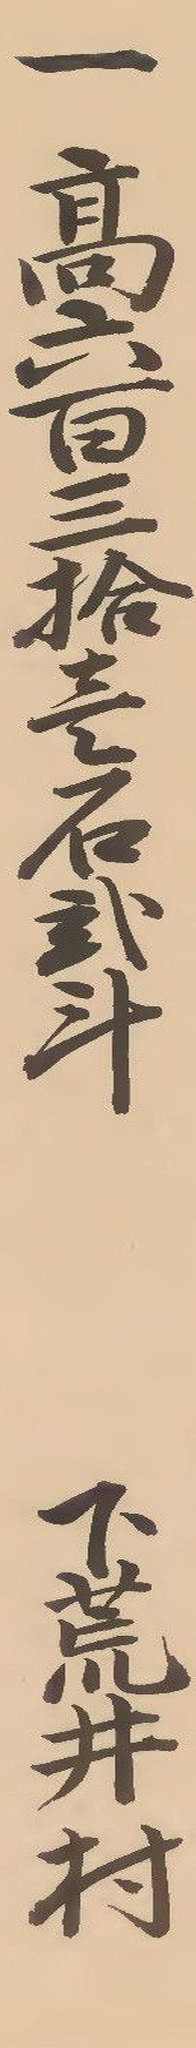一高六百三拾壱石弐斗下荒井村
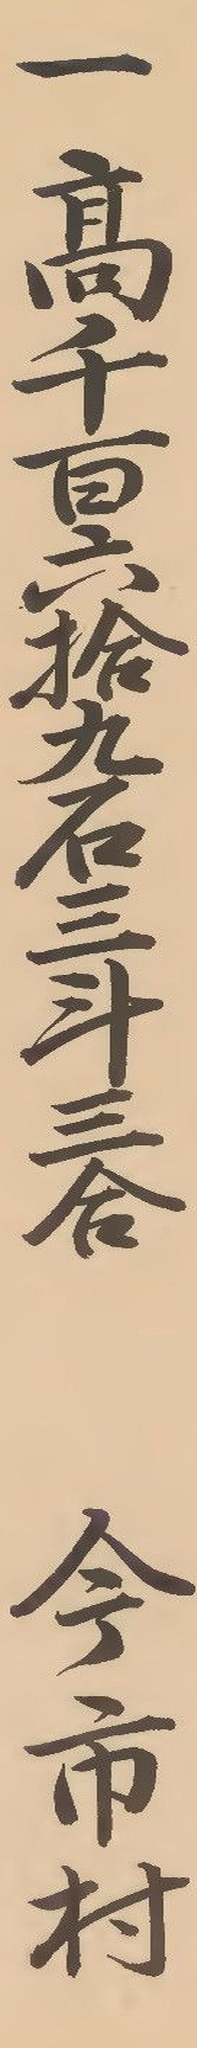一高千百六拾九石三斗三合今市村
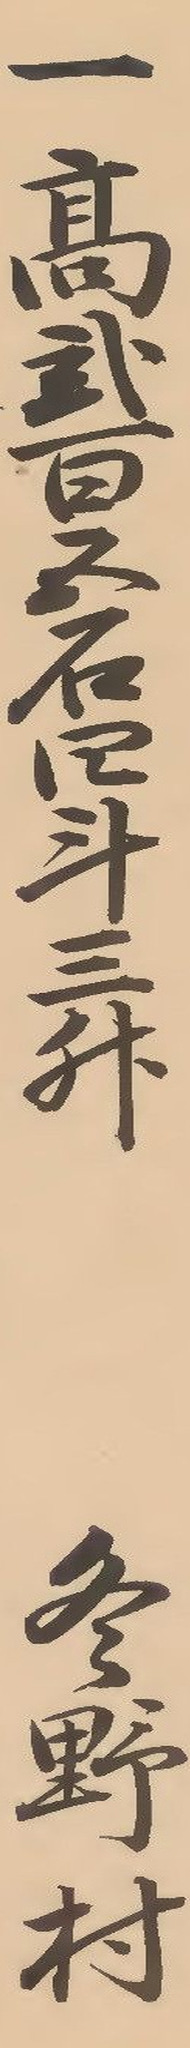一高弐百五石四斗三升冬野村
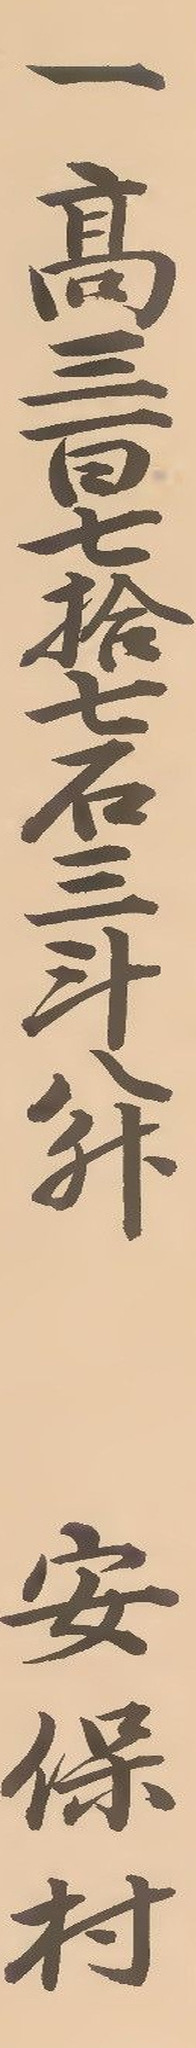一高三百七拾七石三斗八升安保村
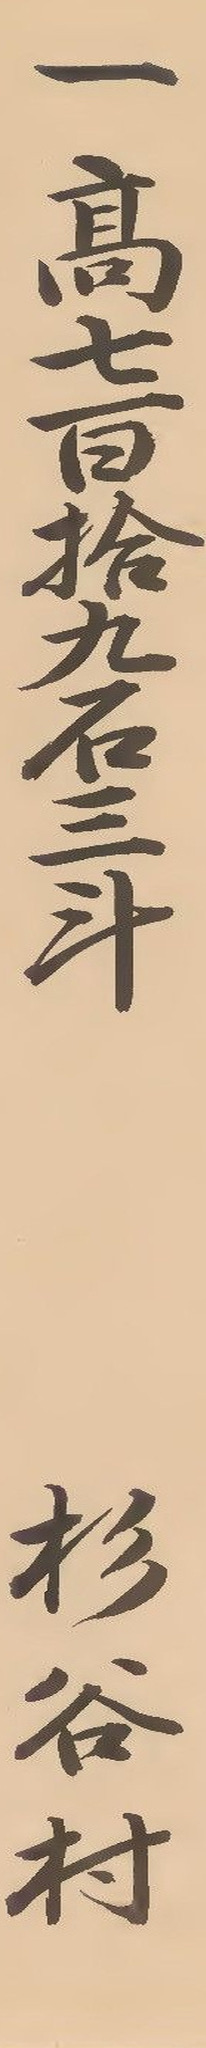一高七百拾九石三斗杉谷村
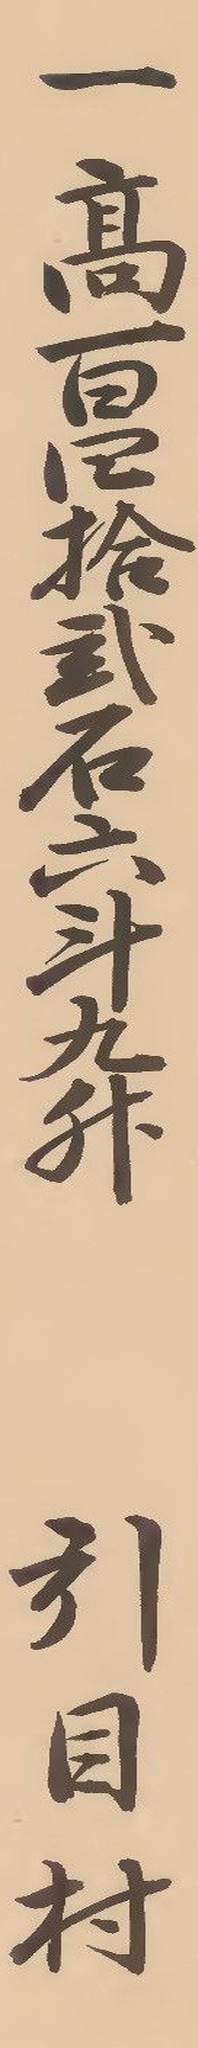一高百四拾弐石六斗九升引目村
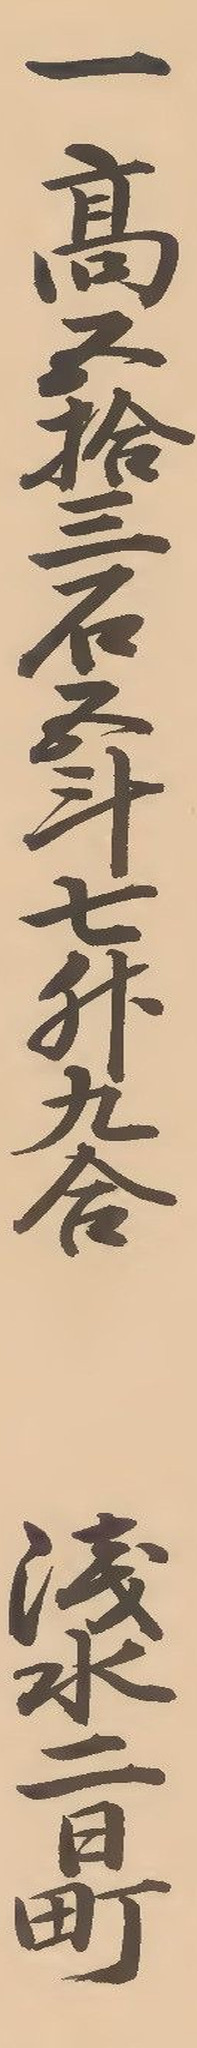一高五拾三石五斗七升九合浅水二日町

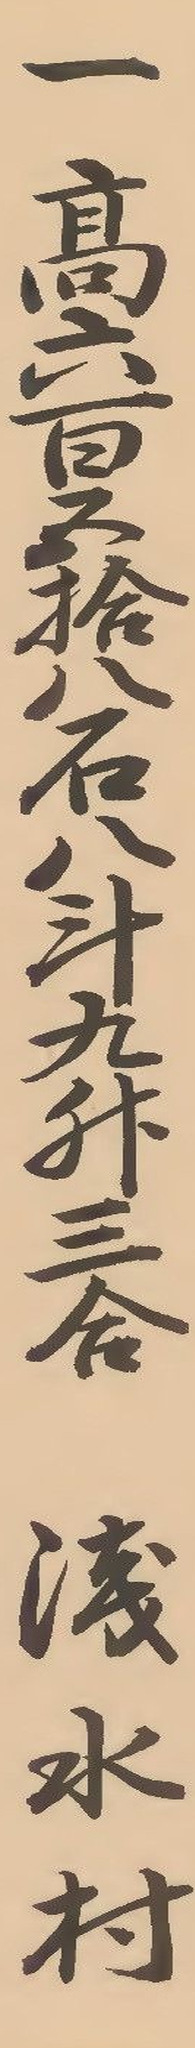一高六百五拾八石八斗九升三合浅水村
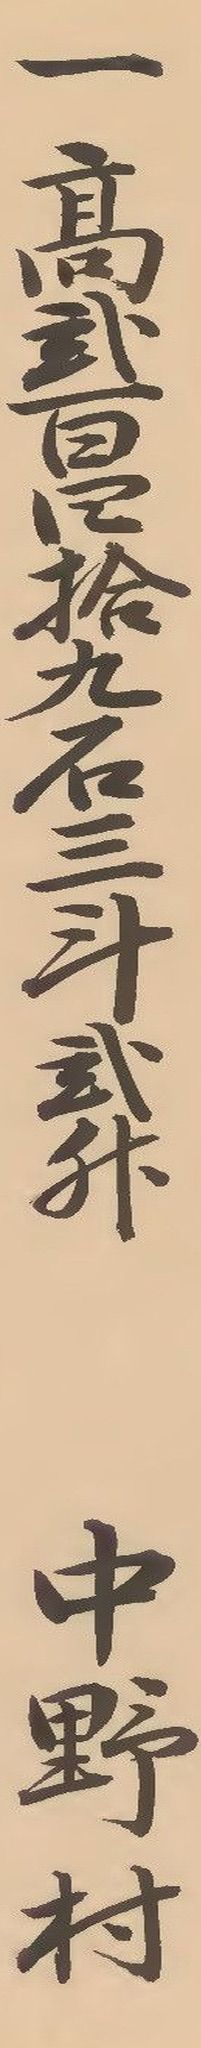一高弐百四拾九石三斗弐升中野村
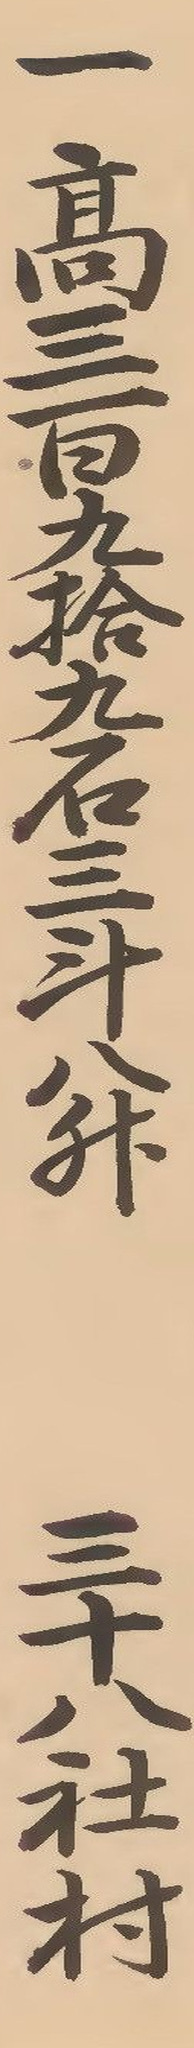一高三百九拾九石三斗八升三十八社村
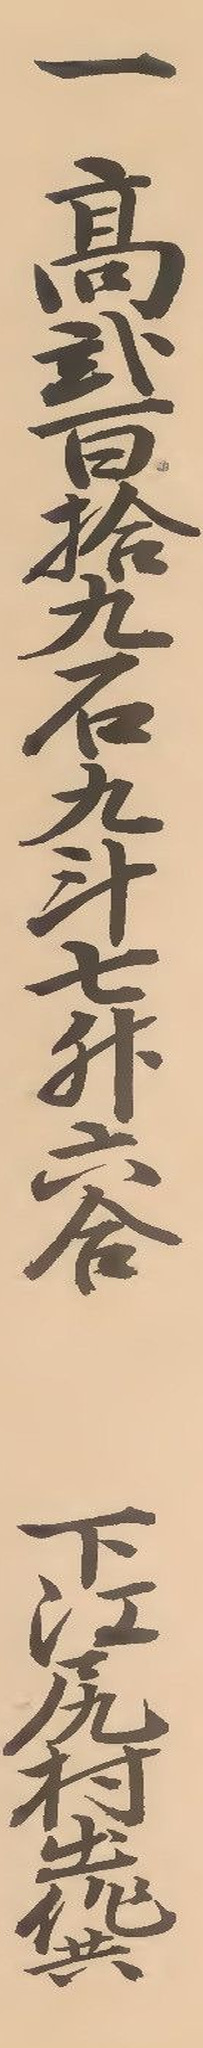一高弐百拾九石九斗七升六合下江尻村出作共
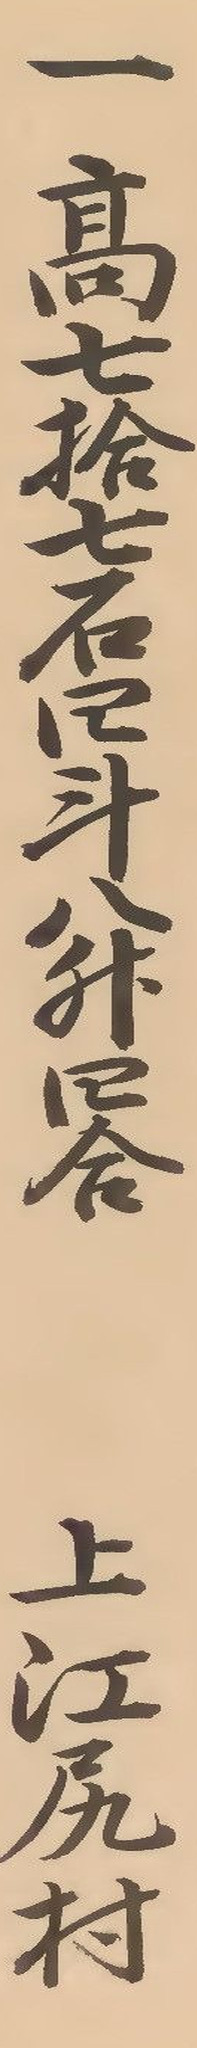一高七拾七石四斗八升四合上江尻村
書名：越前国郷帳
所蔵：国立公文書館 National Archives of Japan
